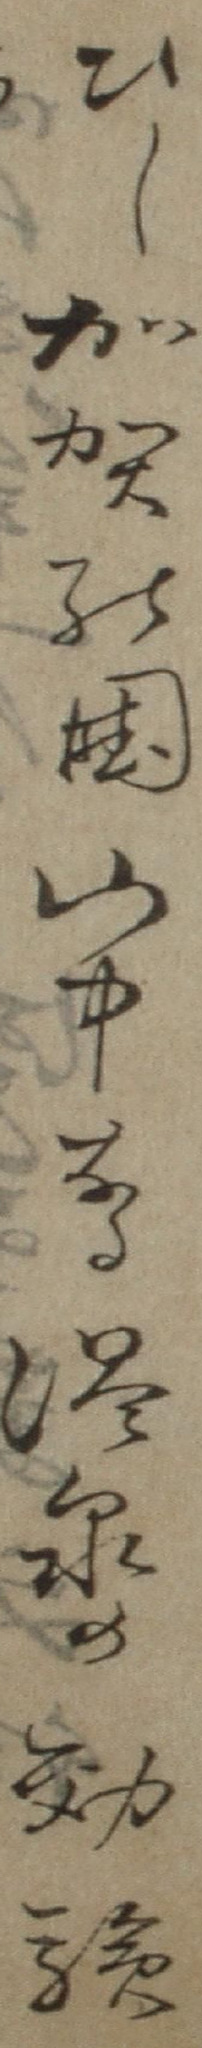ひし加賀の国山中なる温泉の効験
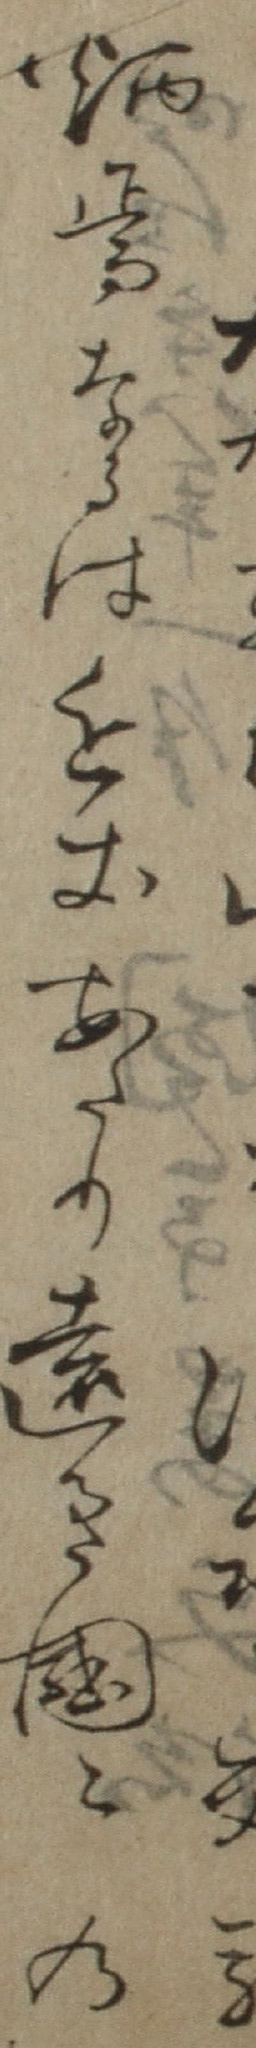炳焉なるは近きあたり遠き国々の
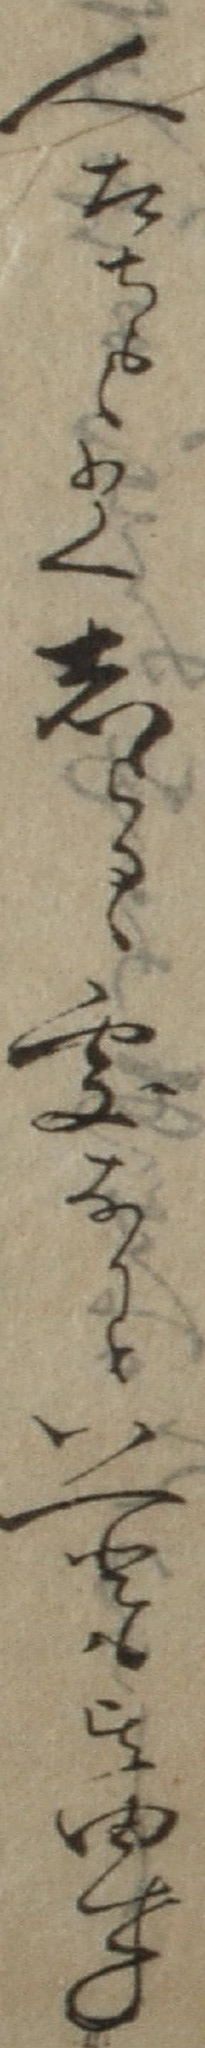人たちもよくしらるゝ處なりといへとも其由来
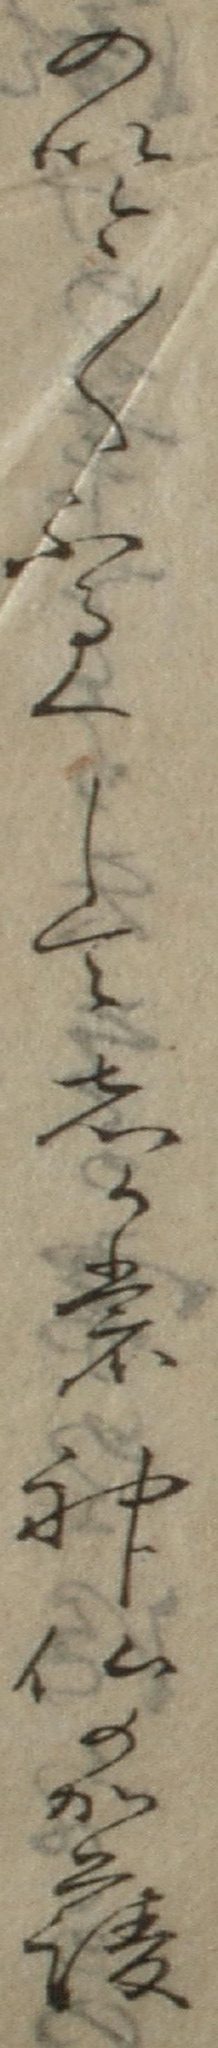のいと〳〵ふるくしてしかも神仏の加護
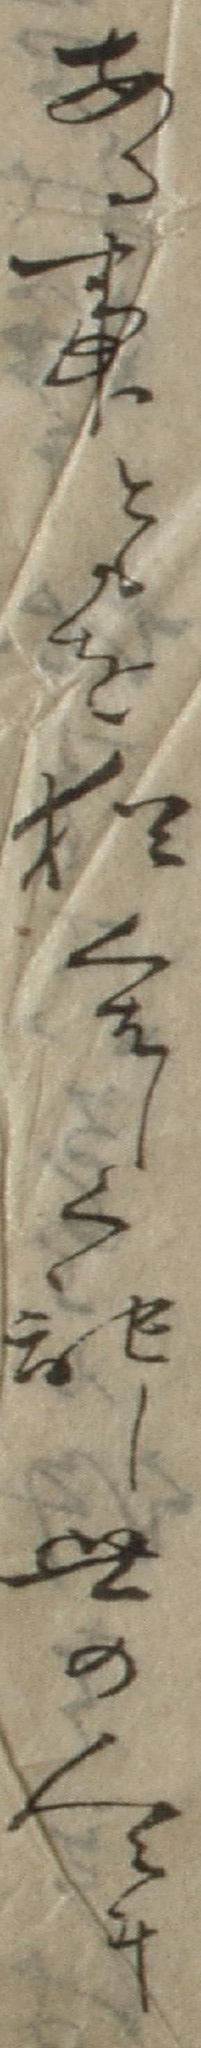ある事ともを猶くはしく記し世の人々に
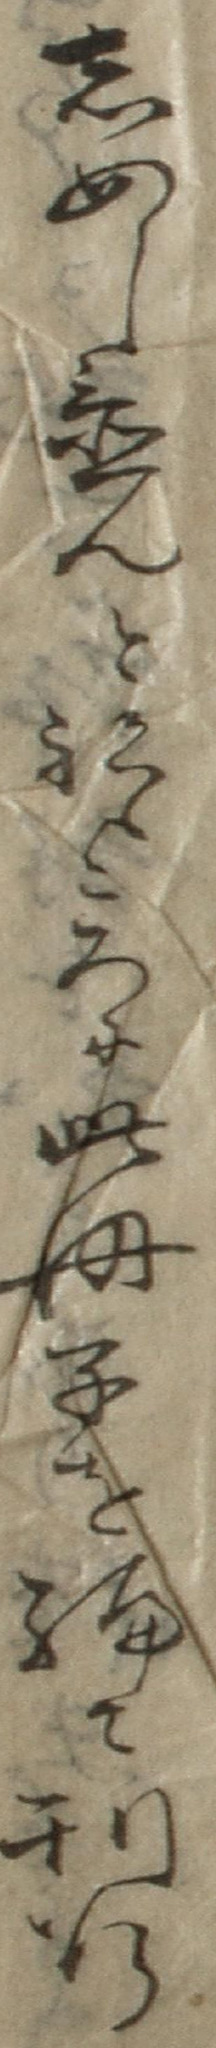しめし置んと祢むころに此冊子を編て刊行
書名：山中温泉縁記并ニ入浴之心得
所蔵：東京大学地震研究所図書室 Earthquake Research Institute Library, The University of Tokyo, JAPAN
